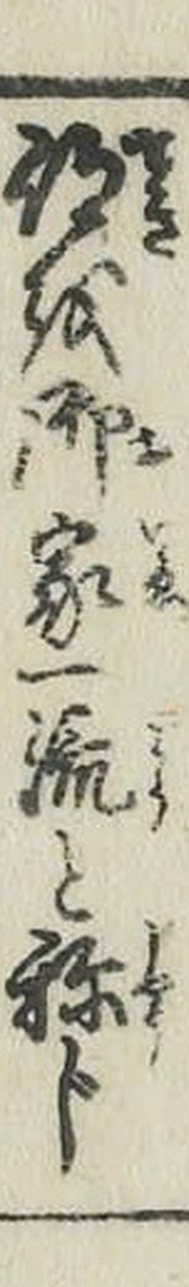跡を御家一流と称じ
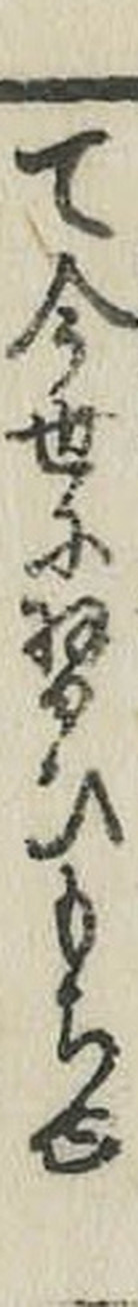て今世に習ひもちゆ

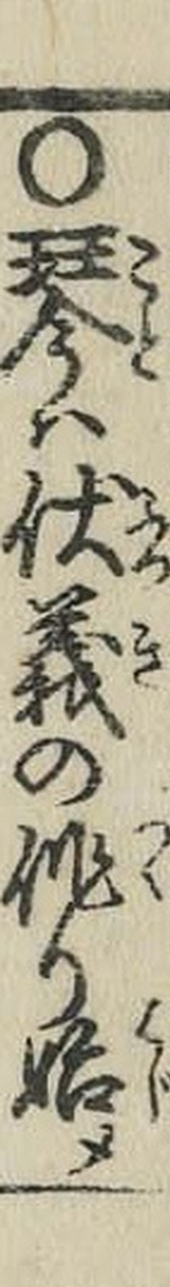○琴は伏羲の作り始
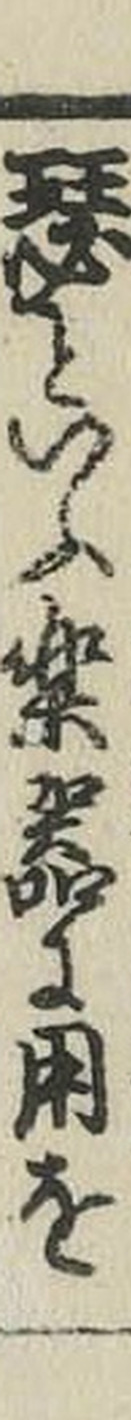瑟といふ楽器に用を
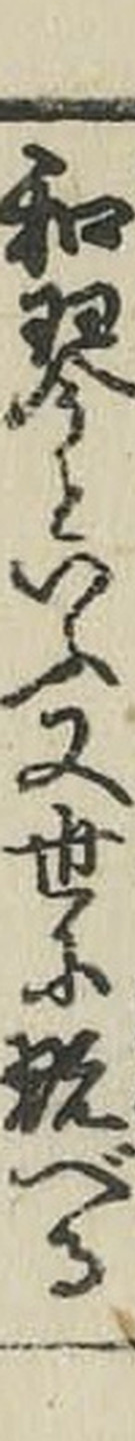和琴といふ又世に翫べる
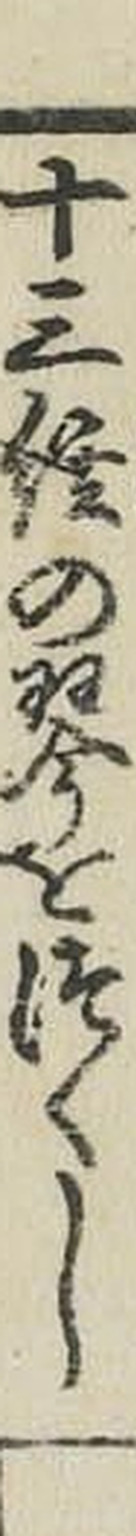十三弦の琴をつくし
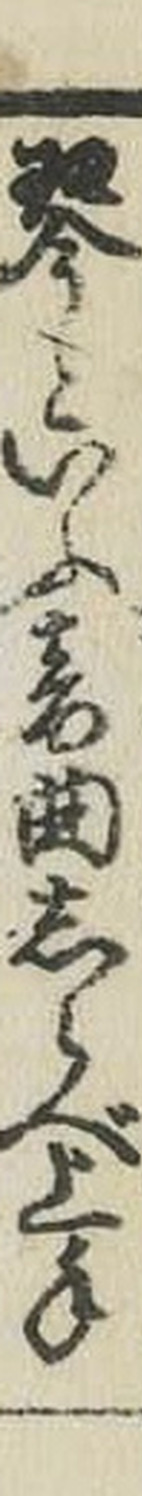琴といふ音曲しらべ上手
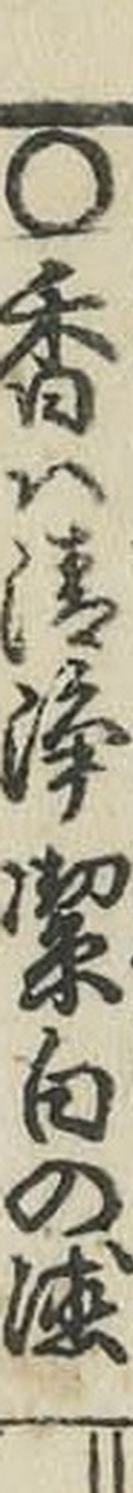○香は清浄潔白の徳
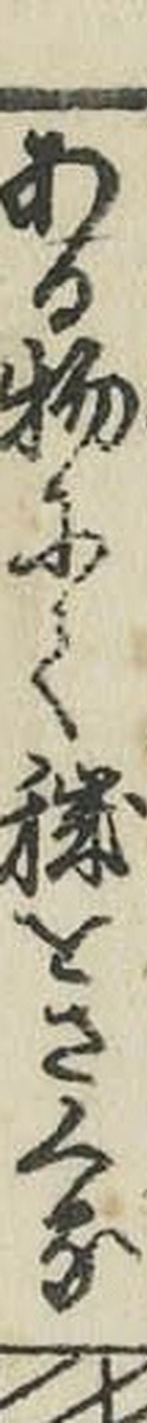ある物にて穢をさくる
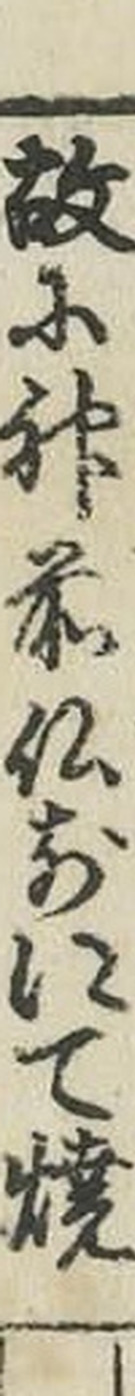故に神前仏前にて焼
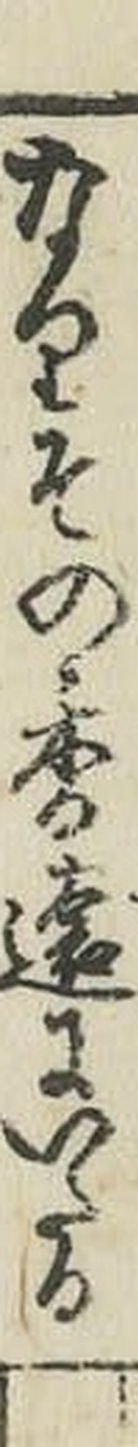なりその香遠きにいたる
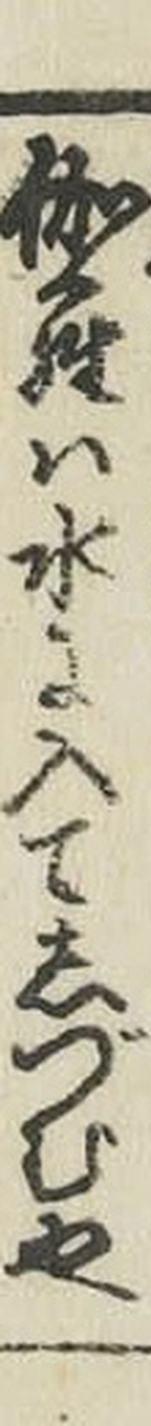伽羅は水に入てしづむ也
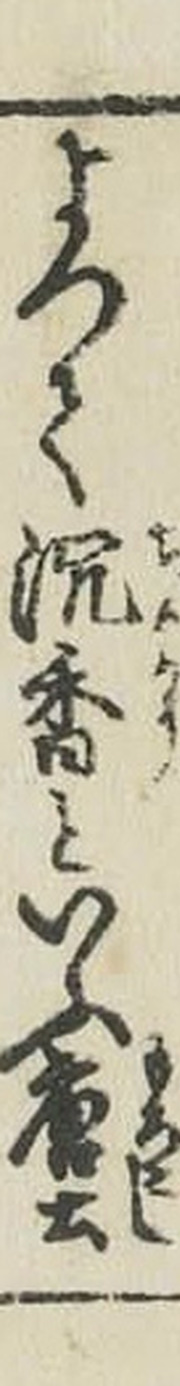よつて沈香といふ唐土
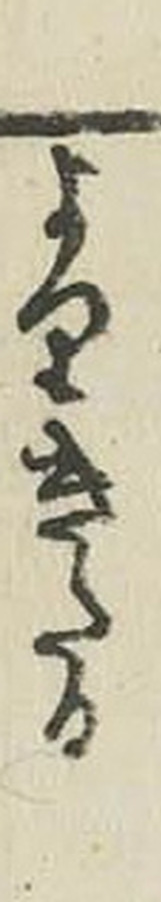よりきたる
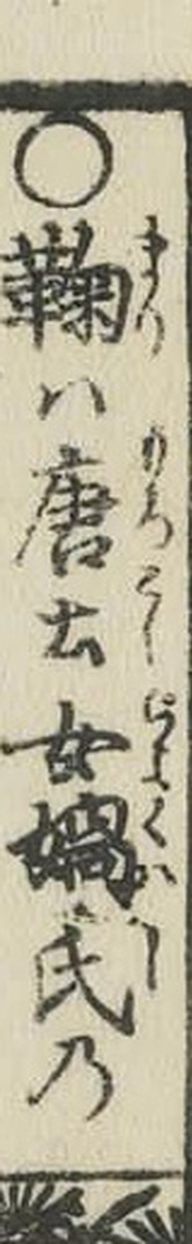○鞠は唐土女媧氏の
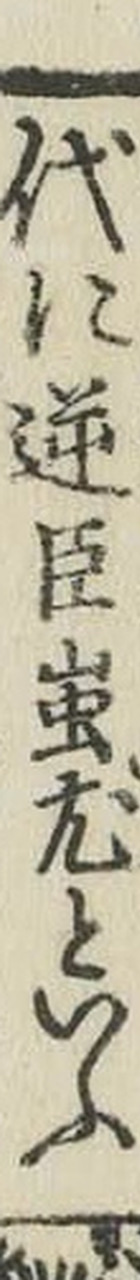代に逆臣蚩尤といふ
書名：増補頭書訓蒙図彙大成 10巻 10:巻之21
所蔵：東京学芸大学教育コンテンツアーカイブ
